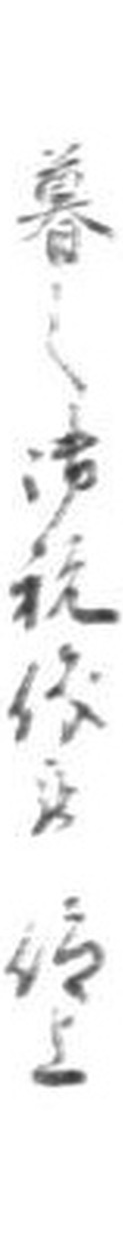暮之御祝儀被仰上

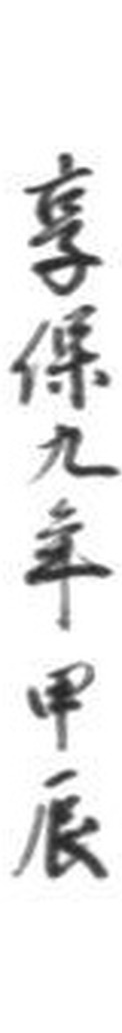享保九年甲辰
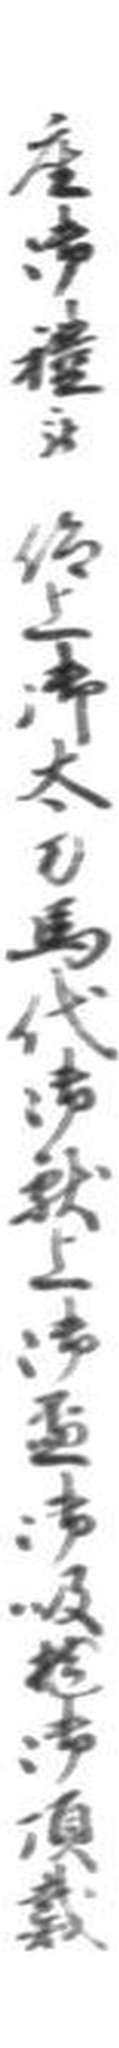座御礼被仰上御太刀馬代御献上御盃御吸物御頂戴
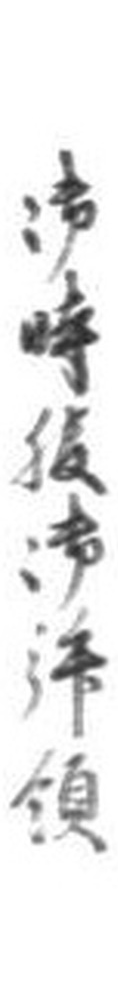御時服御拝領
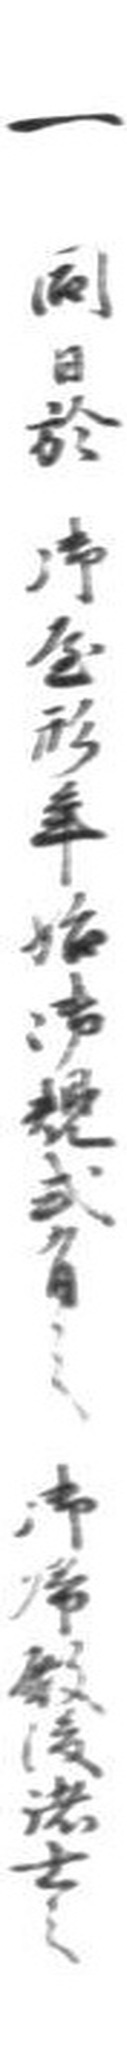一同日於御屋形年始御規式有之御帰殿後諸士之
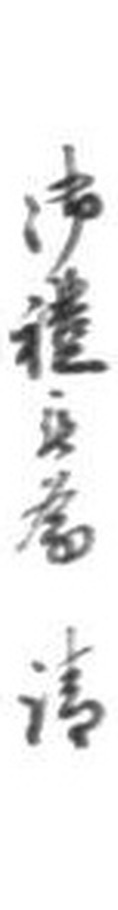御礼被為請
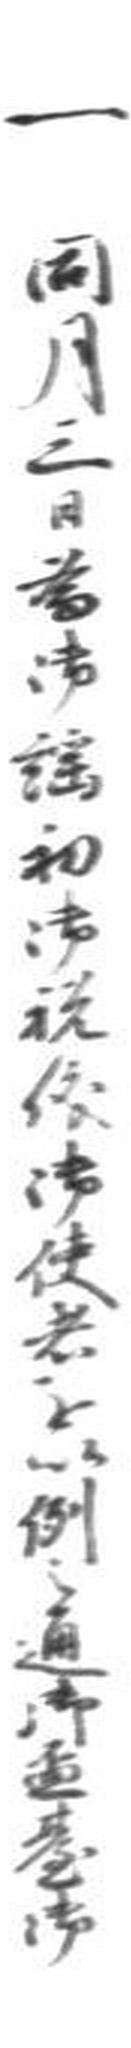一同月三日為御謡初御祝儀御使者を以例之通御盃台御
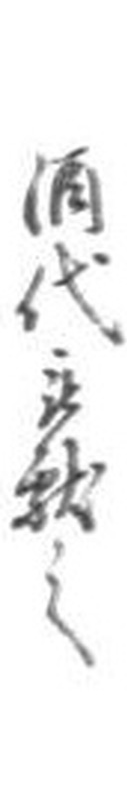酒代被献之

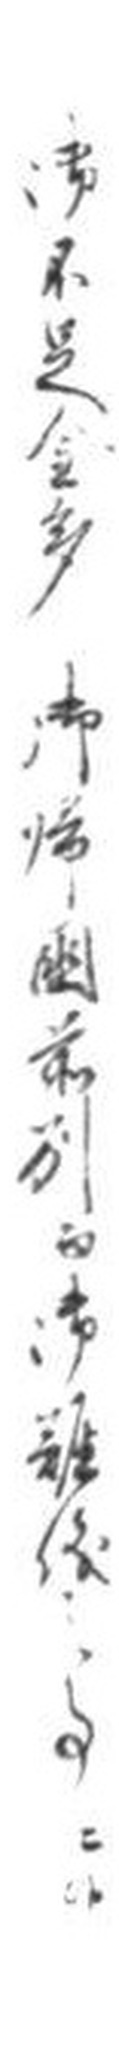御不足金多御帰国前別而御難儀之事ニ候
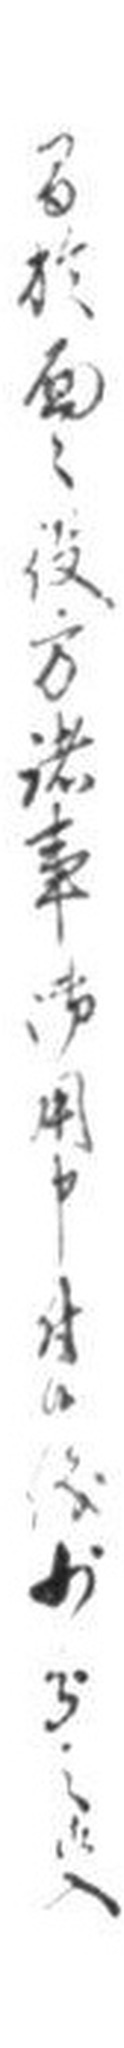間於面々役方諸事御用申付候儀少分之御入
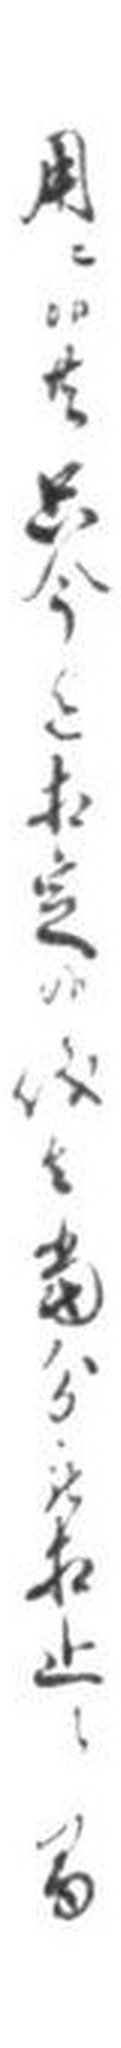用ニ候共只今迄相定候儀者当分被相止候間
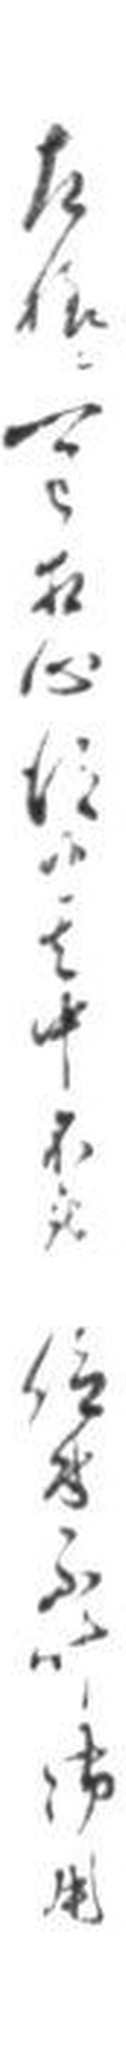左様ニ可被相心得候其中不被仰付不叶御用
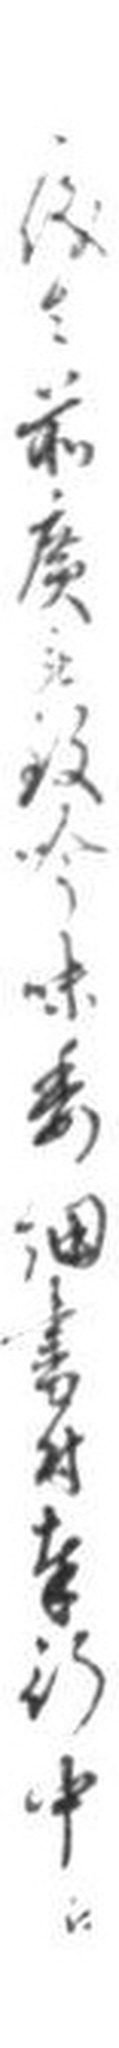之儀者前広被致吟味委細書付奉行中江
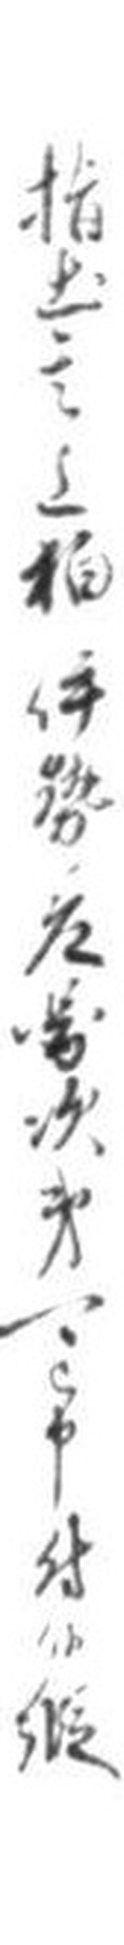指出其上狛伊勢差図次第可被申付候縦
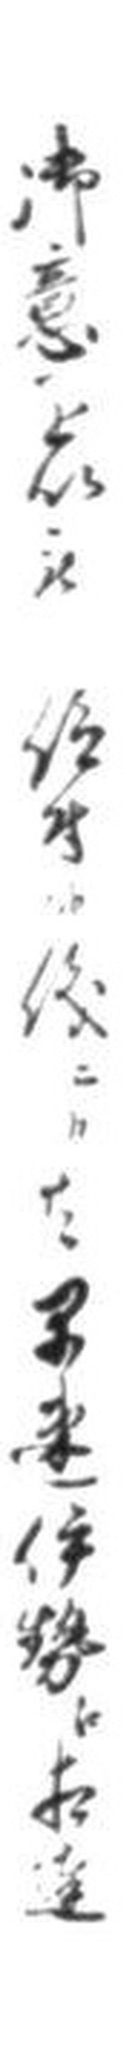御意を以被仰付候儀ニ候共早速伊勢江相達
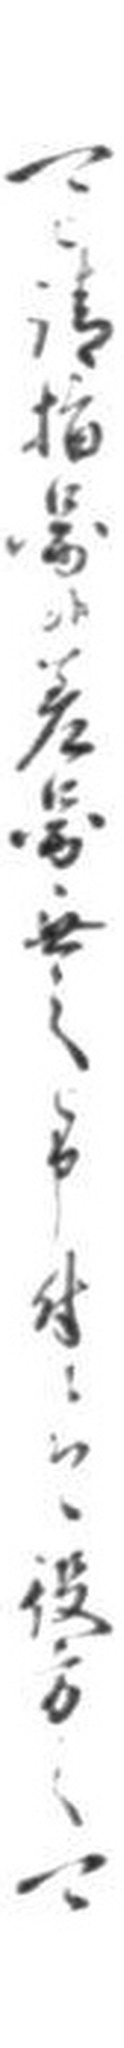可被請指図候差図無之被申付候ハヽ役方之可
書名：家譜 三十六 宗昌公 従享保八年到同九年
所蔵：福井県文書館 Fukui Prefectural Archives
